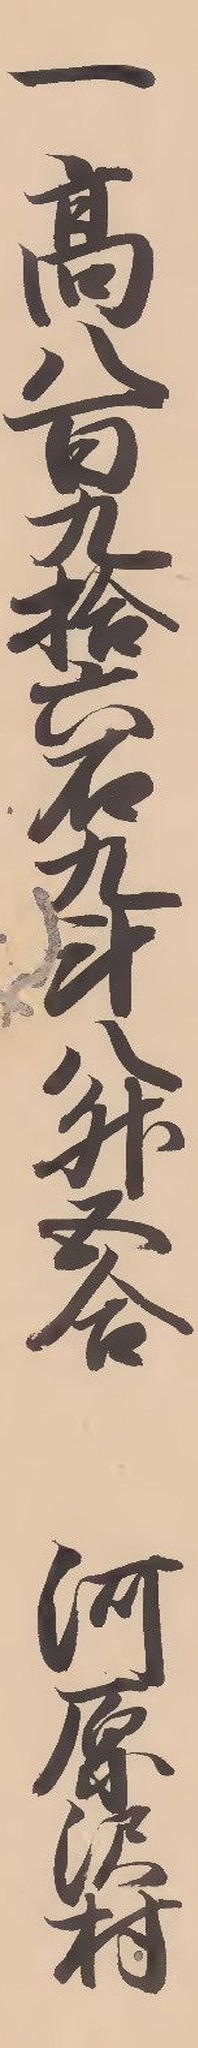一高八百九拾六石九斗八升五合河原沢村

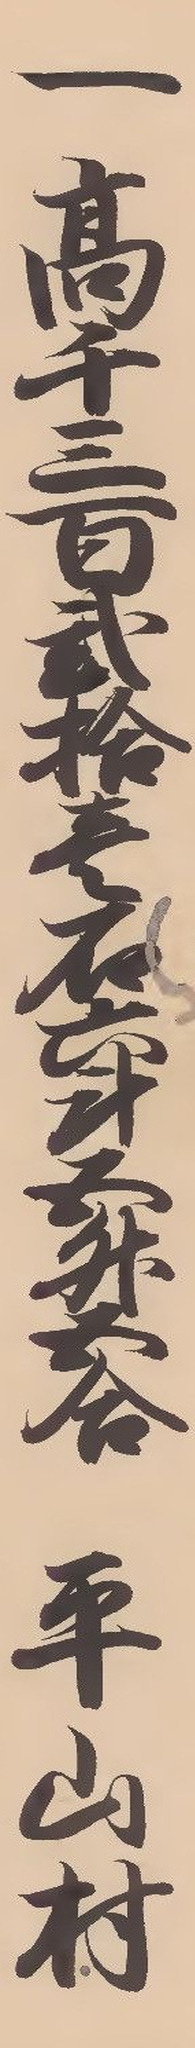一高千三百弐拾壱石六斗五升五合平山村
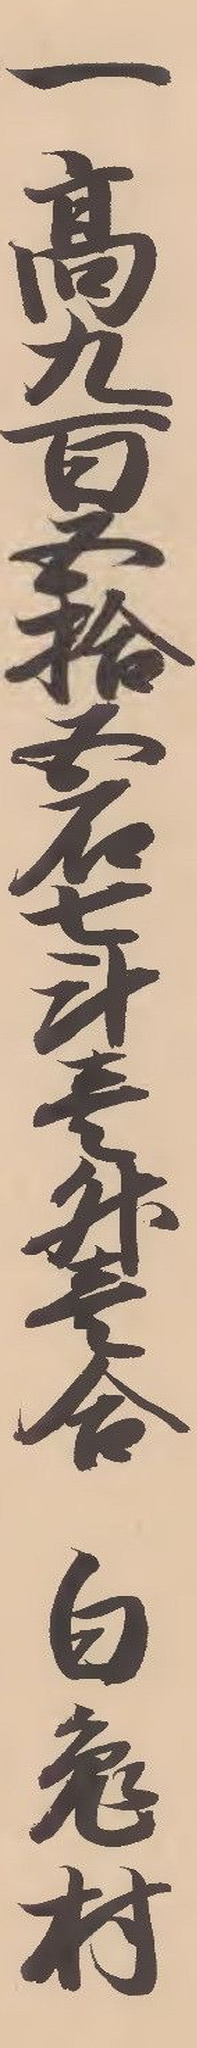一高九百五拾五石七斗壱升壱合白兎村
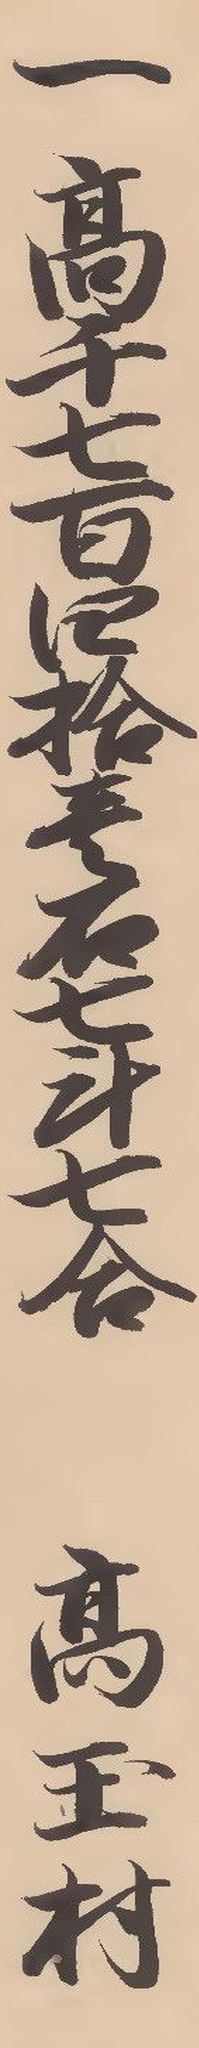一高千七百四拾壱石七斗七合高玉村
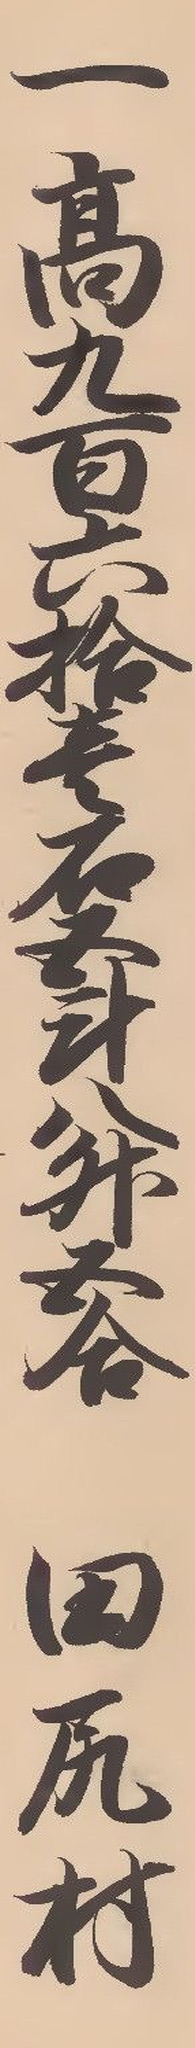一高九百六拾壱石五斗八升五合田尻村
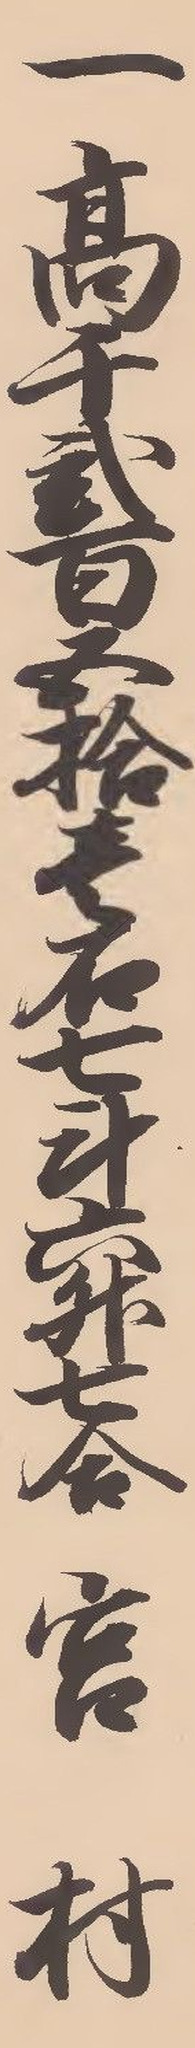一高千弐百五拾壱石七斗六升七合宮村
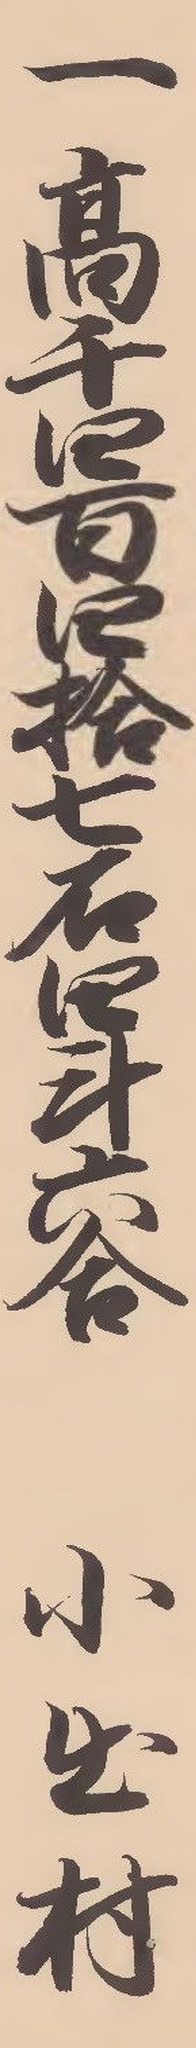一高千四百四拾七石四斗六合小出村
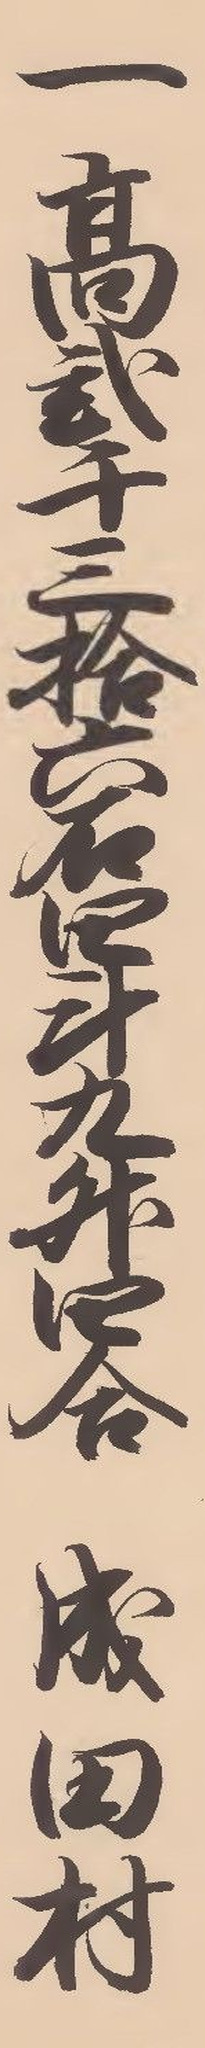一高弐千三拾六石四斗九升四合成田村
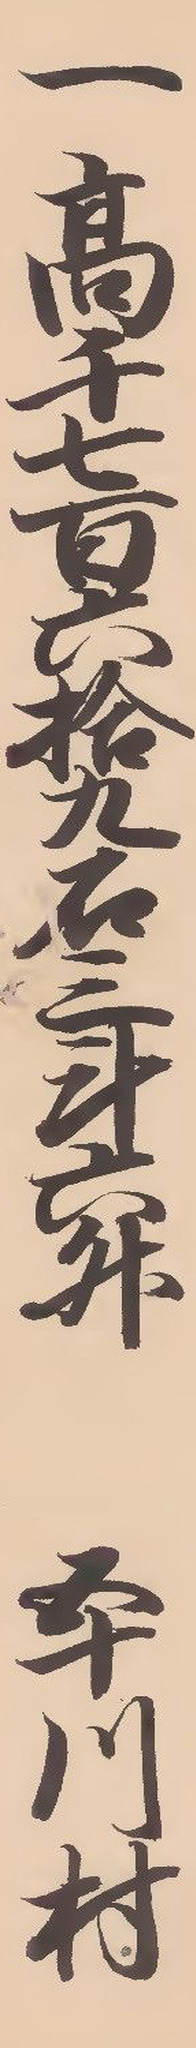一高千七百六拾九石三斗六升五十川村

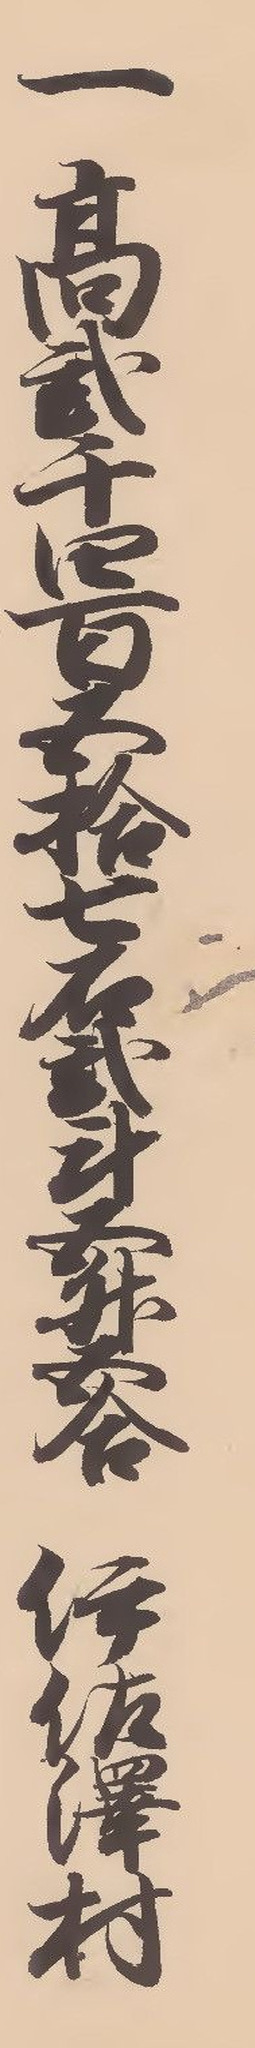一高弐千四百五拾七石弐斗五升五合伊佐沢村
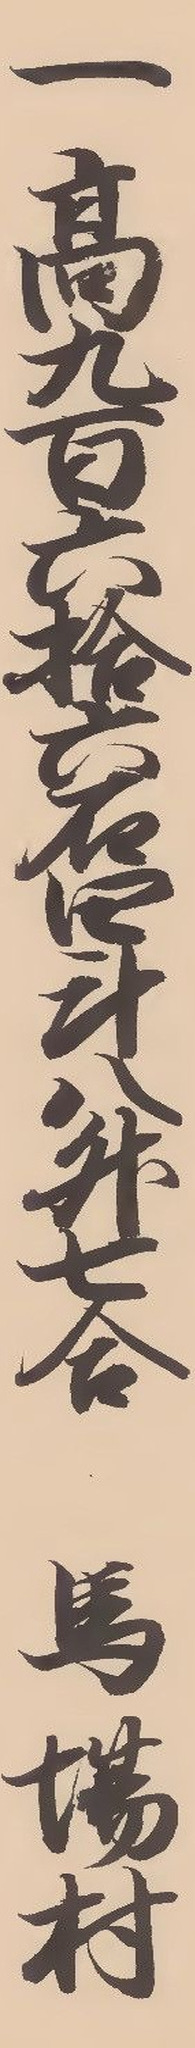一高九百六拾六石四斗八升七合馬場村
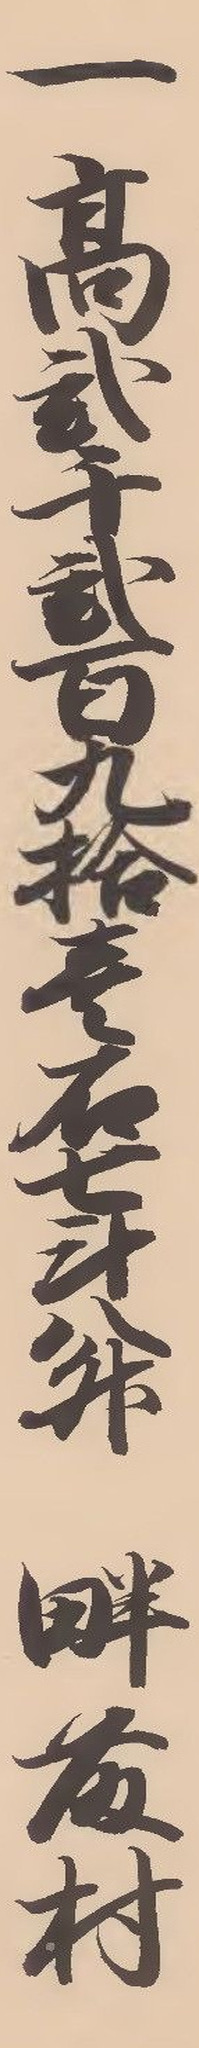一高弐千弐百九拾壱石七斗八升畔藤村
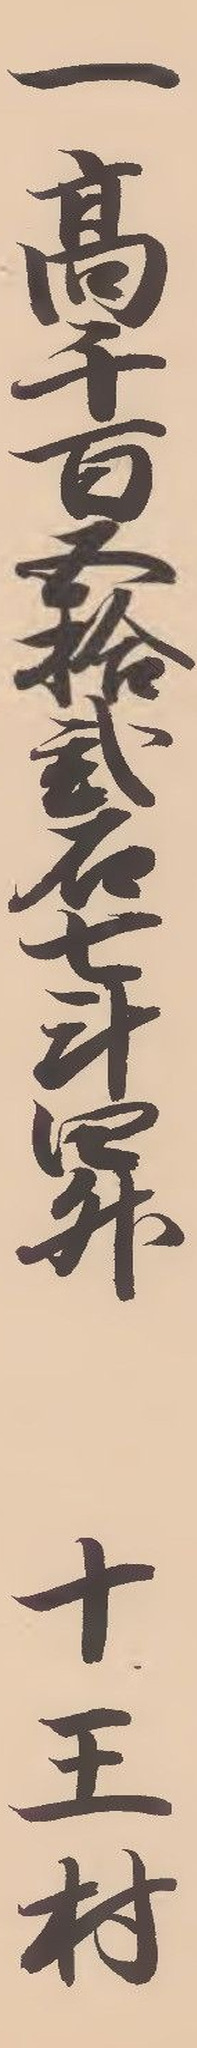一高千百五拾弐石七斗四升十王村
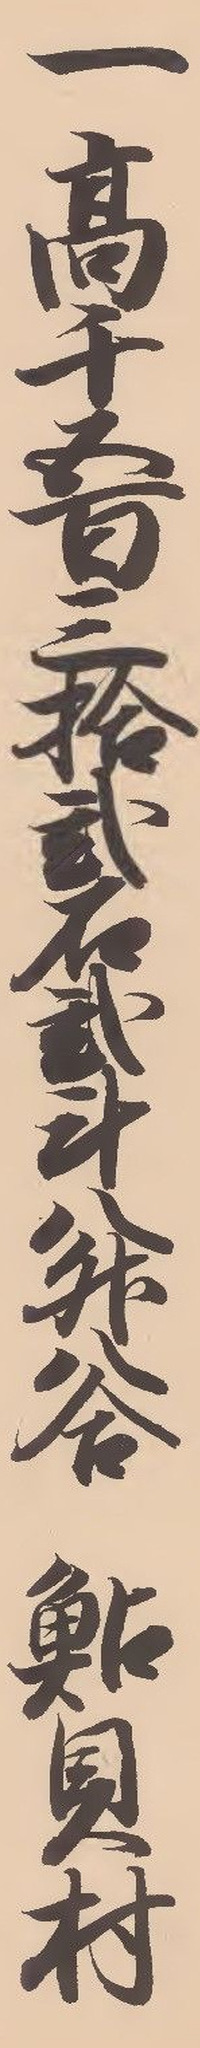一高千五百三拾弐石弐斗八升八合鮎貝村
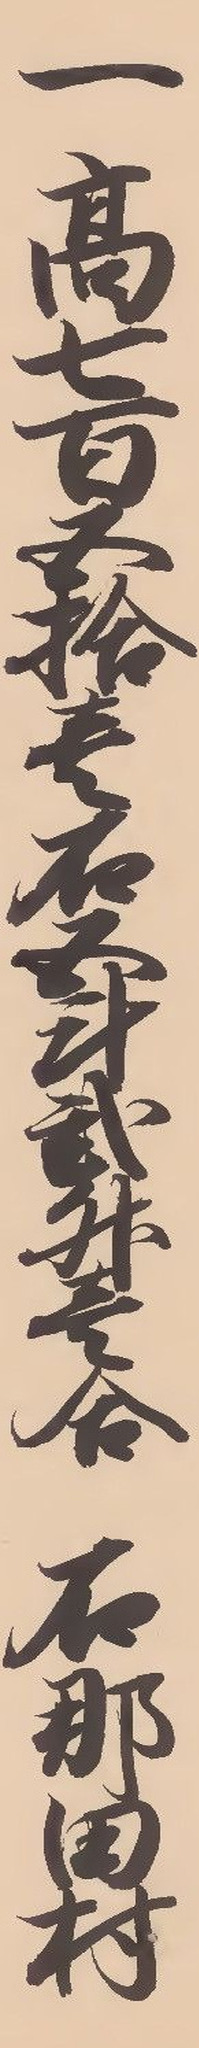一高七百五拾壱石五斗弐升壱合石那田村
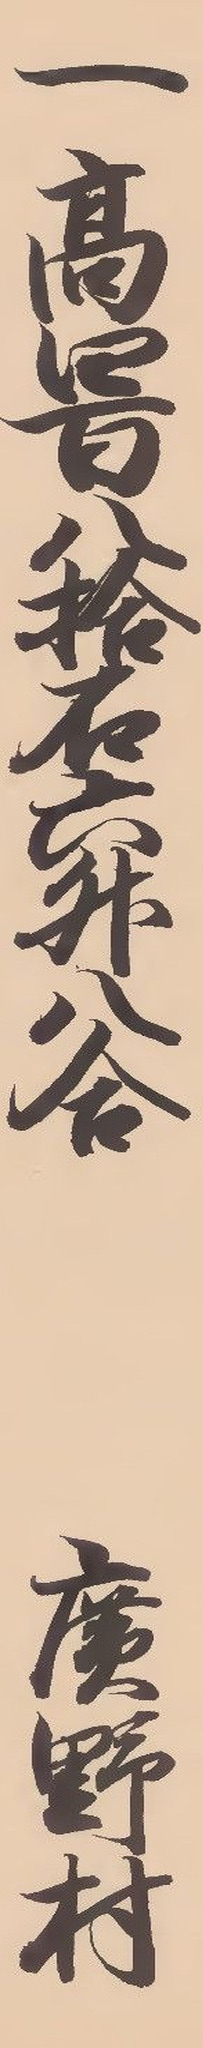一高四百八拾石六升八合広野村
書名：出羽国郷帳　１
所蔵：国立公文書館 National Archives of Japan
